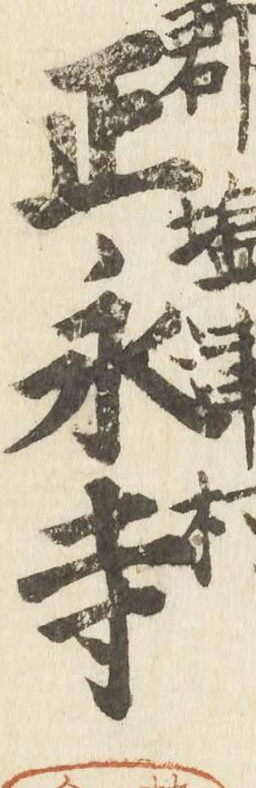正永寺

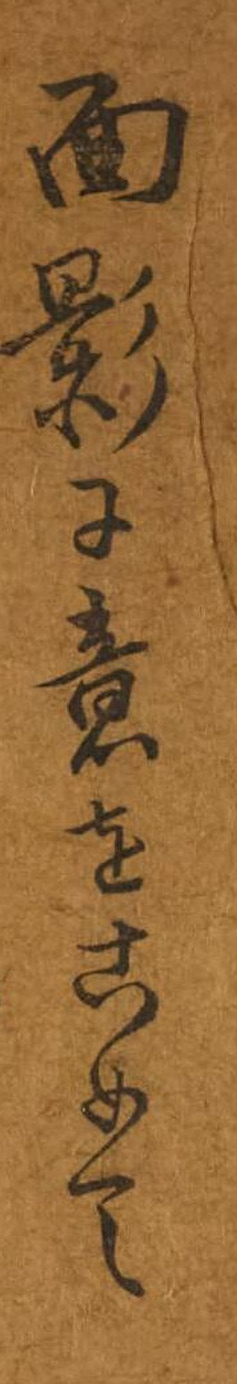面影に意をこめて
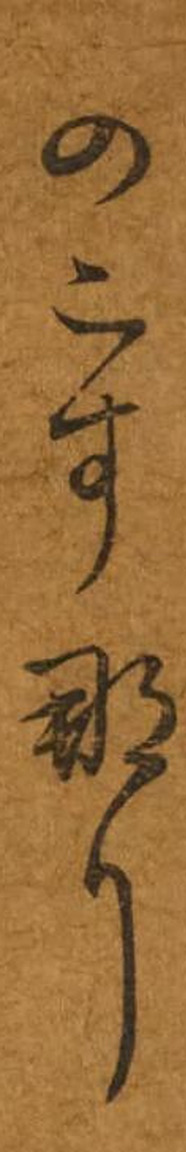のこすなり
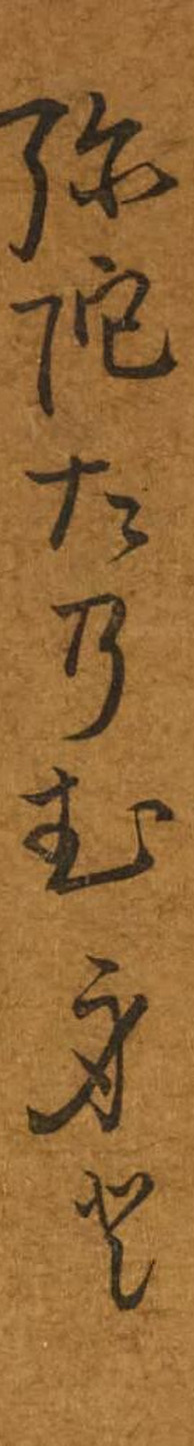弥陀たのむ身と
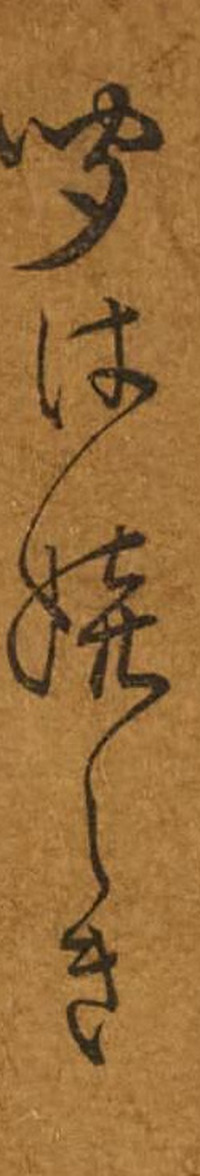聞は嬉しき
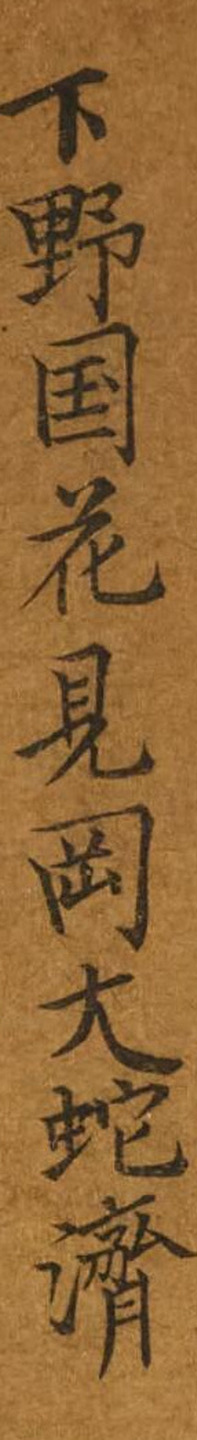下野国花見岡大蛇済
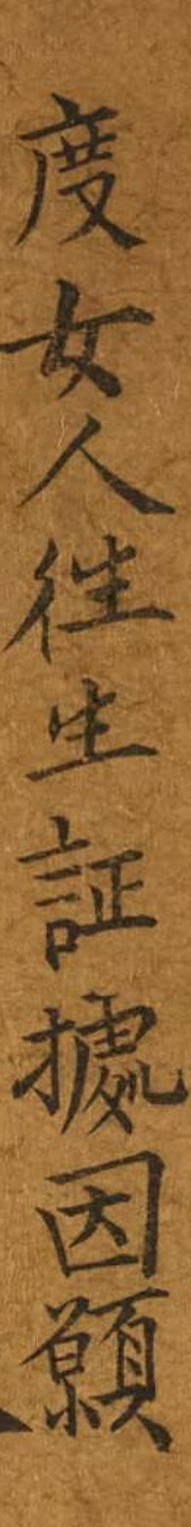度女人往生証拠因願
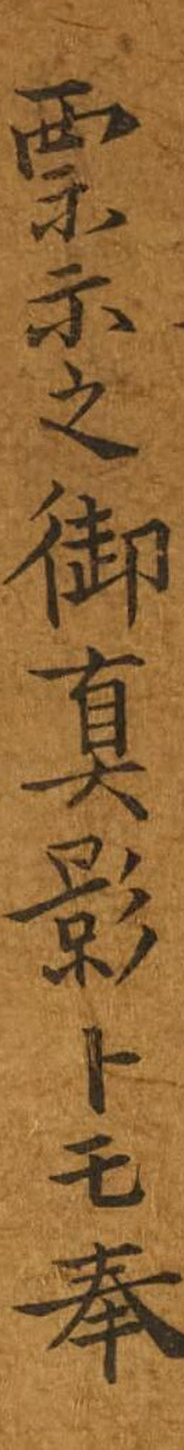票示之御真影とも奉

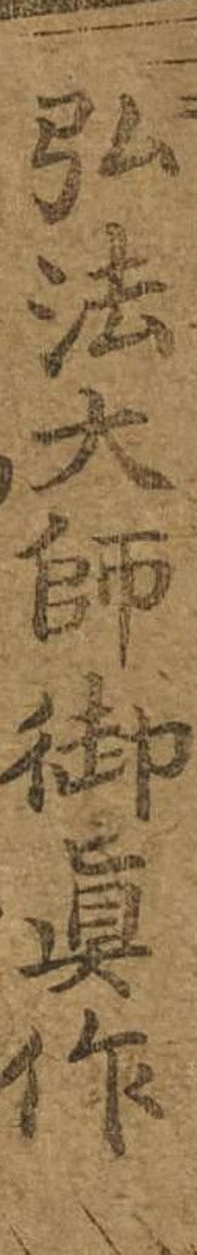弘法大師御真作
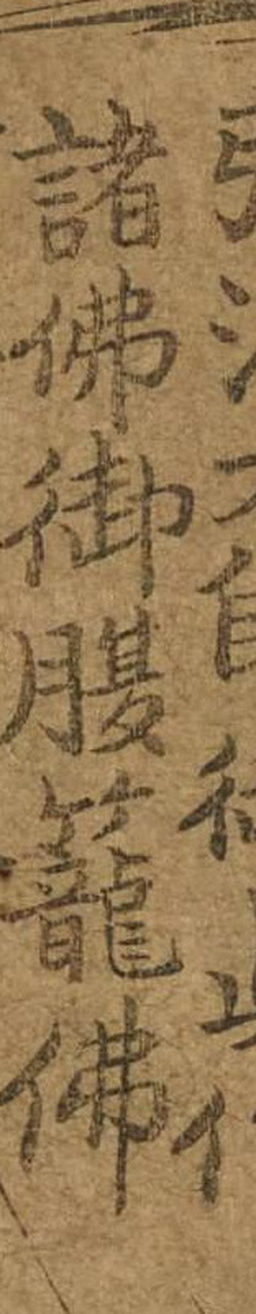諸仏御腹籠仏
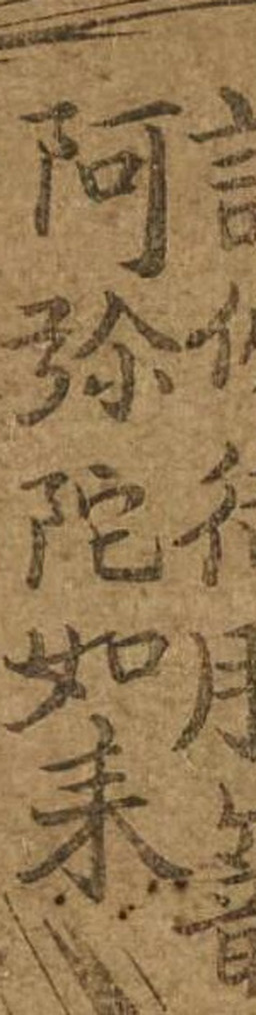阿弥陀如来
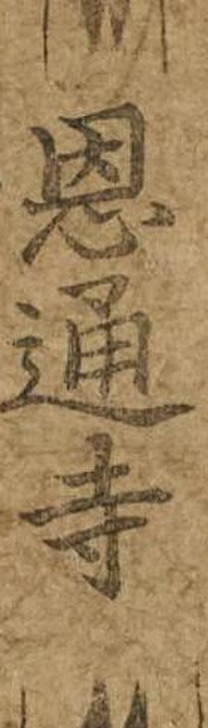恩通寺
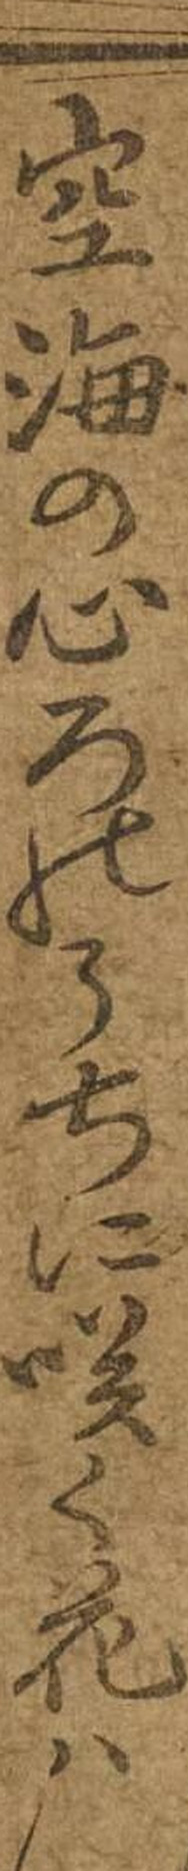空海の心ろのうちに咲く花は
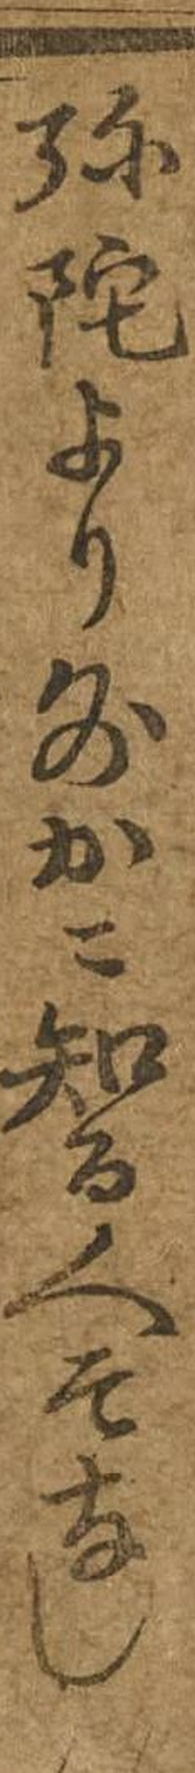弥陀より外かに知る人そなし

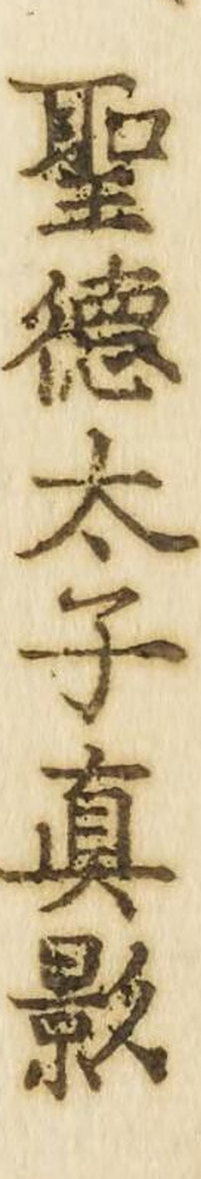聖徳太子真影
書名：加能真宗聖集
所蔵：Ishikawa Prefectural Library
